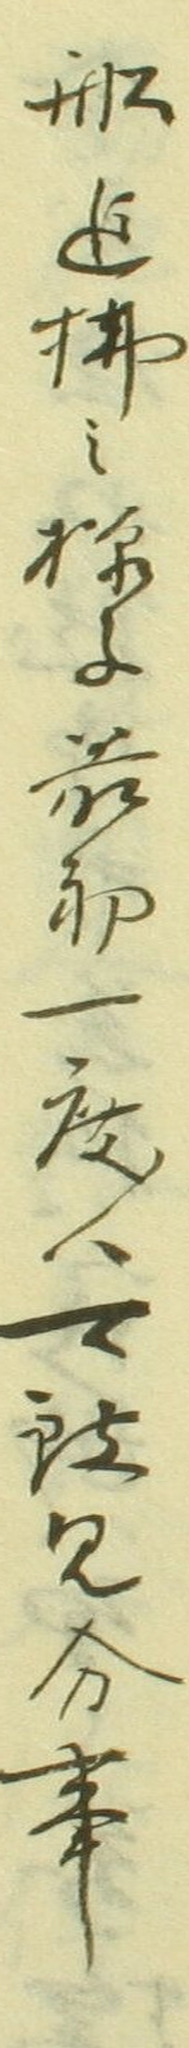船追払之様子最初一度は可致見分事
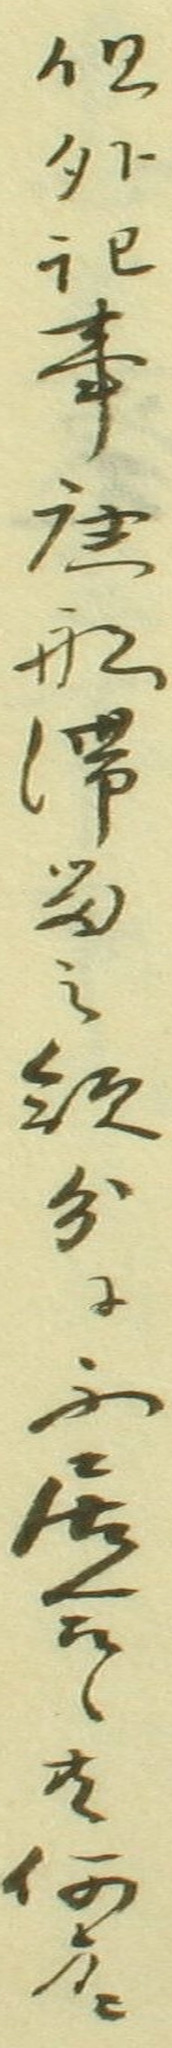但外記事唐船滞留之領分に不居合候共何方ニ
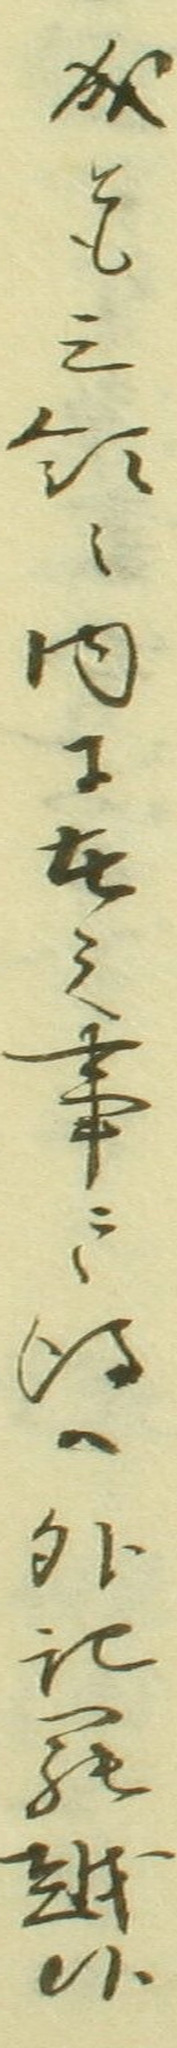成とも三領之内に在之事に候得は外記罷越候
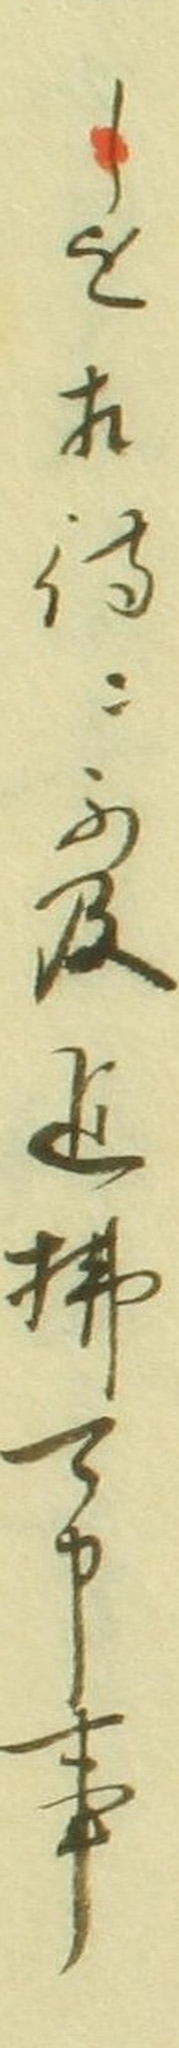を相伝に不及追払可申事
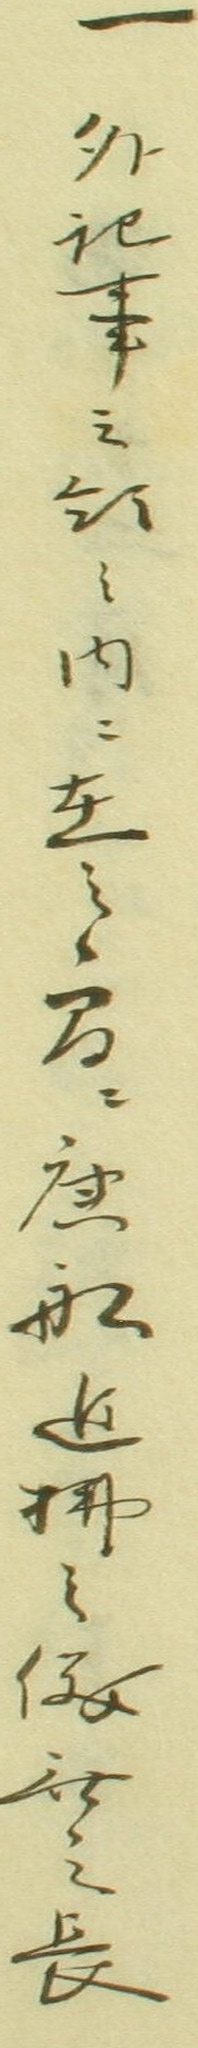一外記事三領之内に在之候間に唐船追払之儀無之長
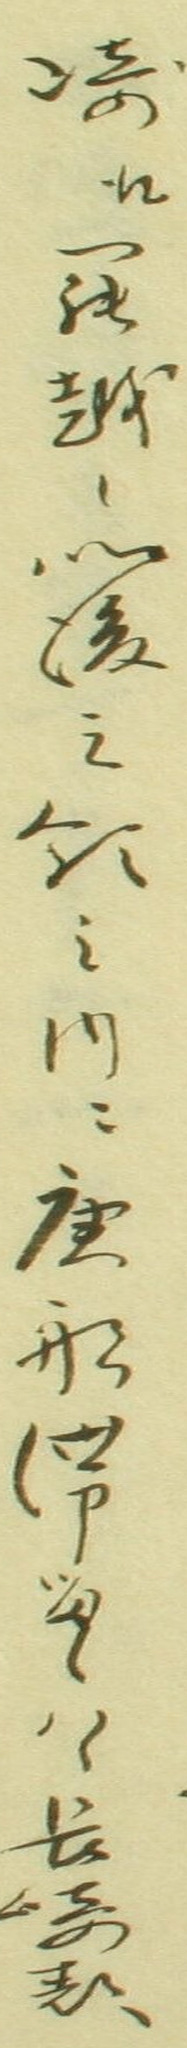崎江罷越候以後三領之内に唐船滞留候はゝ長崎表
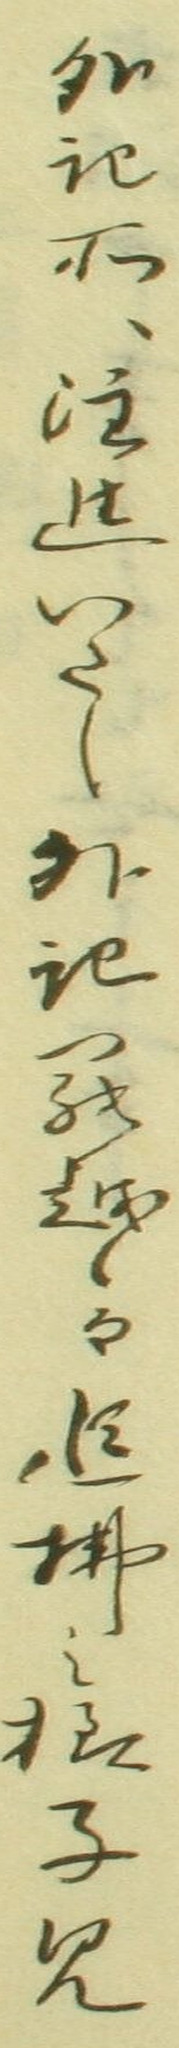外記所へ注進いたし外記罷越候而追払之様子見
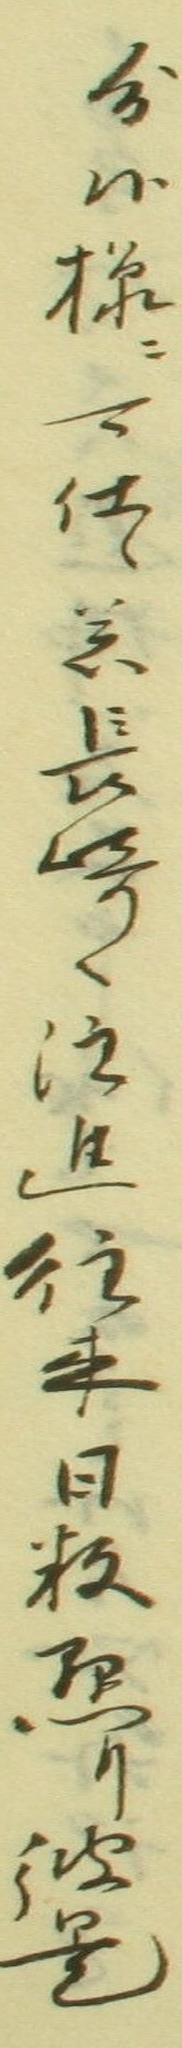分候様ニ可仕候若長崎へ注進往来日数懸り彼是

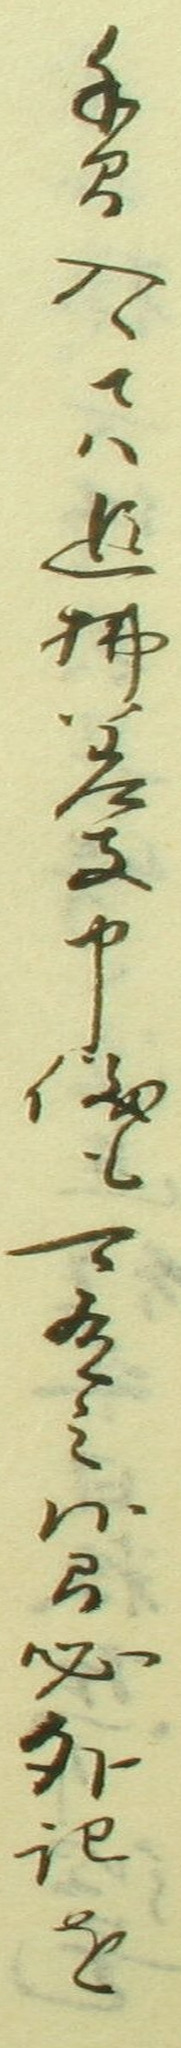手間入候ては追払差支申儀も可有之候間必外記を
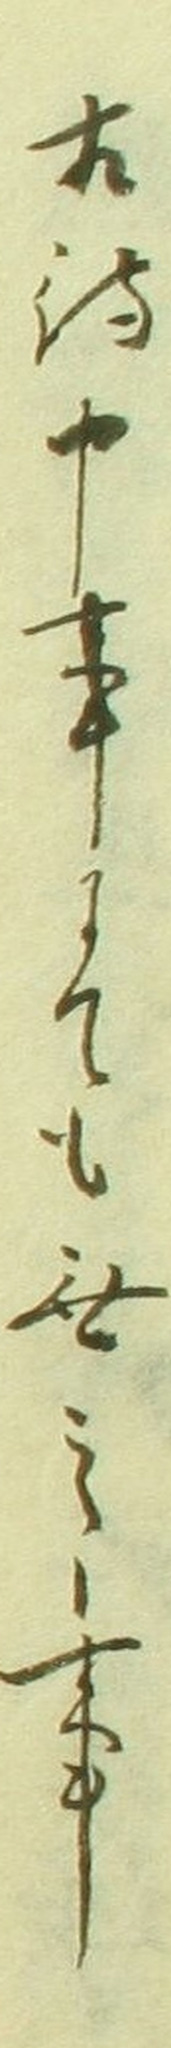相待申事にても無之候事
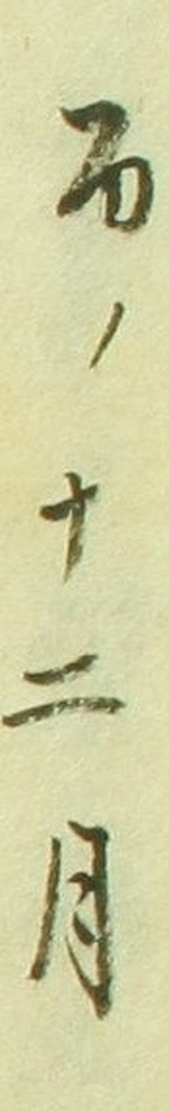酉ノ十二月
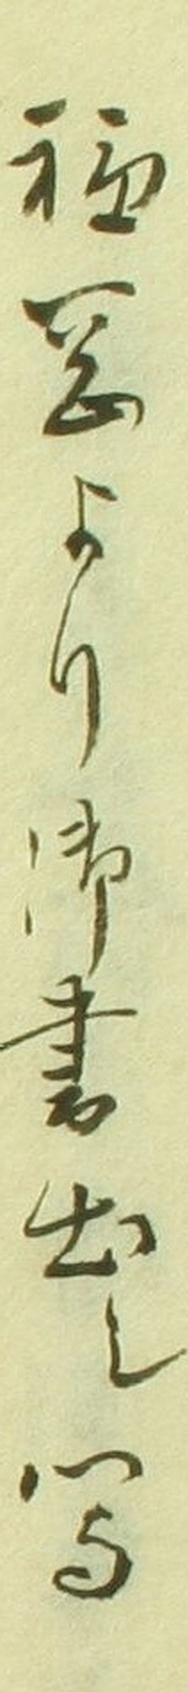福岡より御書出し写
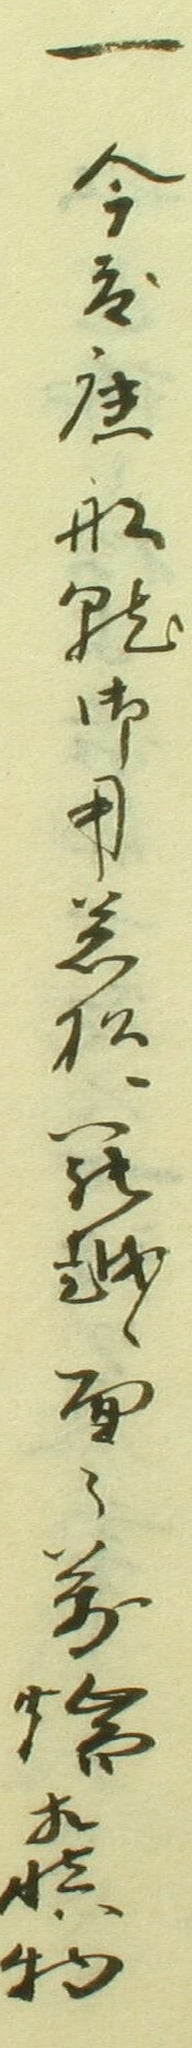一今度唐船就御用若松へ罷越候面々万端相慎物
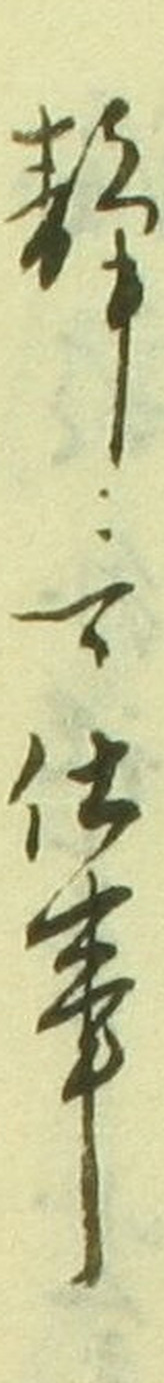静ニ可仕事
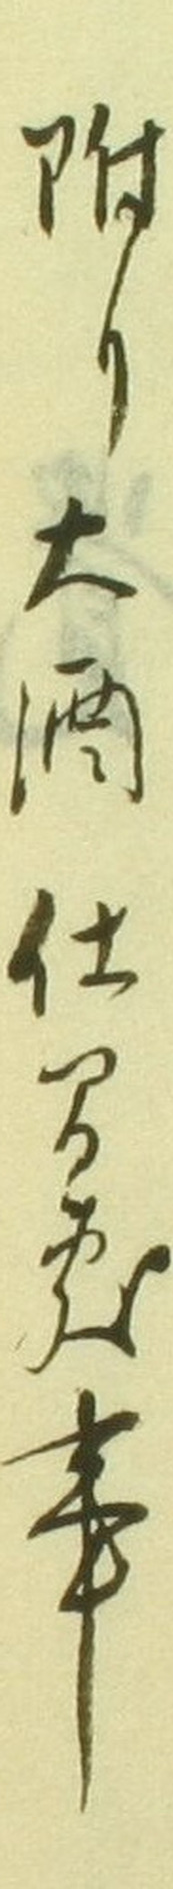附り大酒仕間敷事
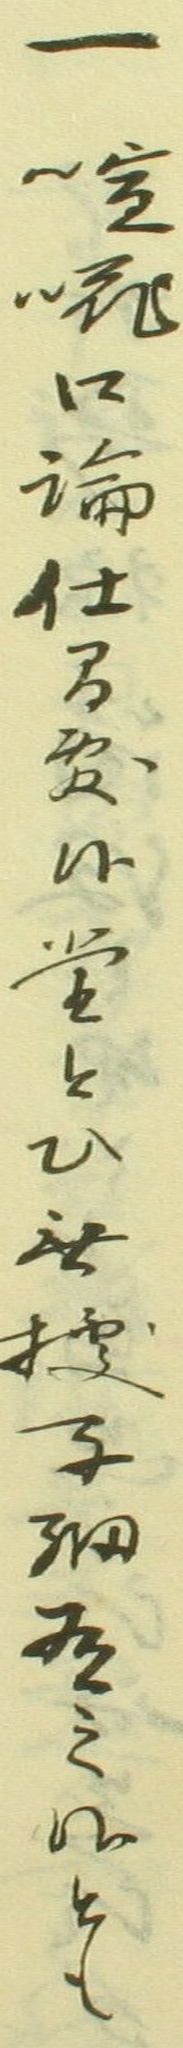一喧嘩口論仕間敷候堂とひ無拠子細有之候とも
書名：唐船漂流記 二
